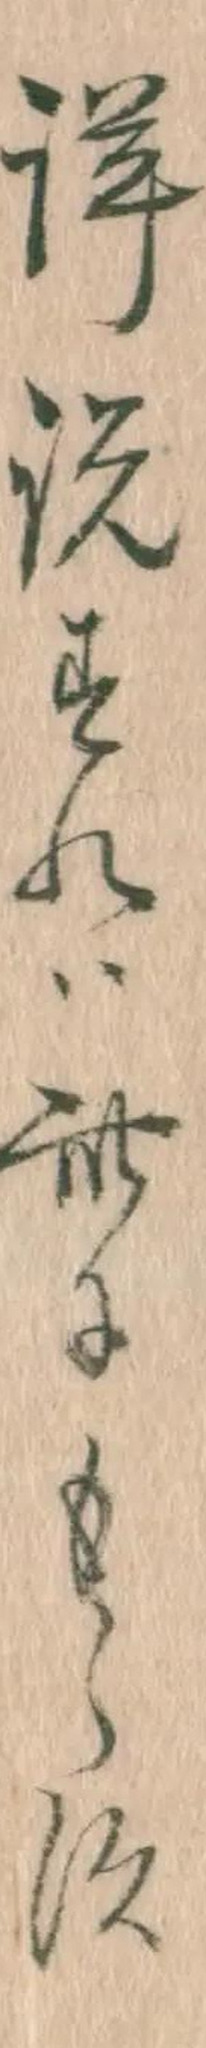詳説すれハ此にもらす
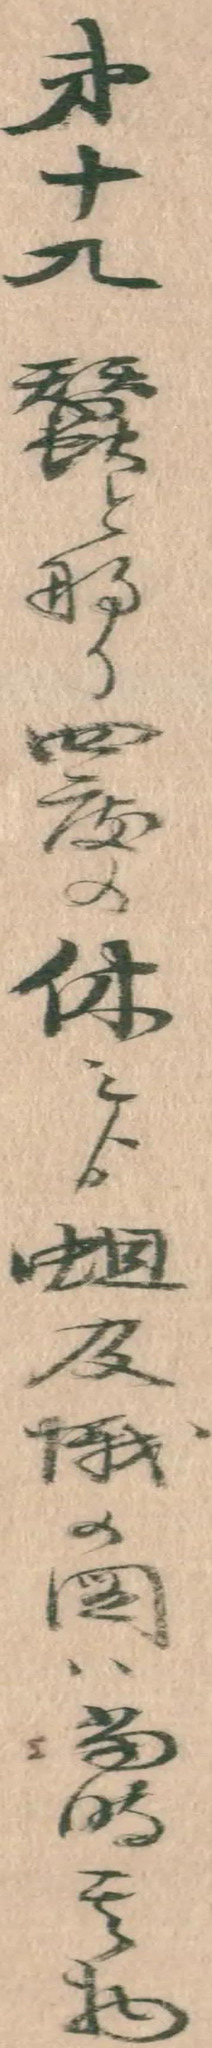第十九蚕となり四度の休ミゟ蛆及蛾の図ハ当時其物
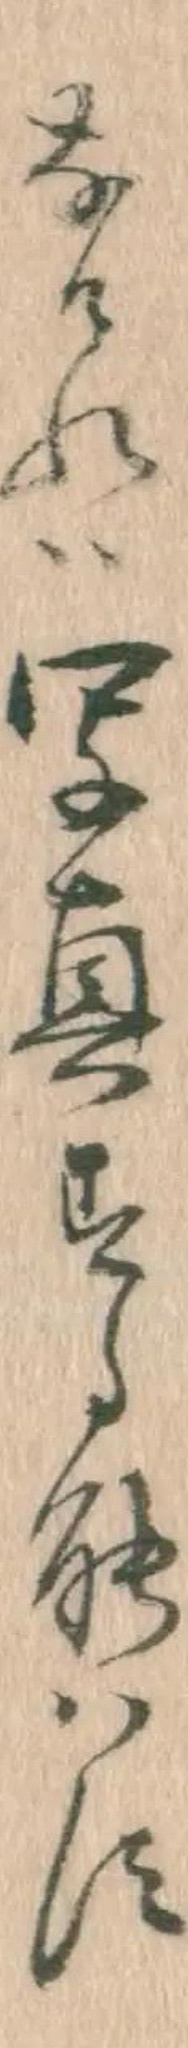なけれハ写真する能ハす
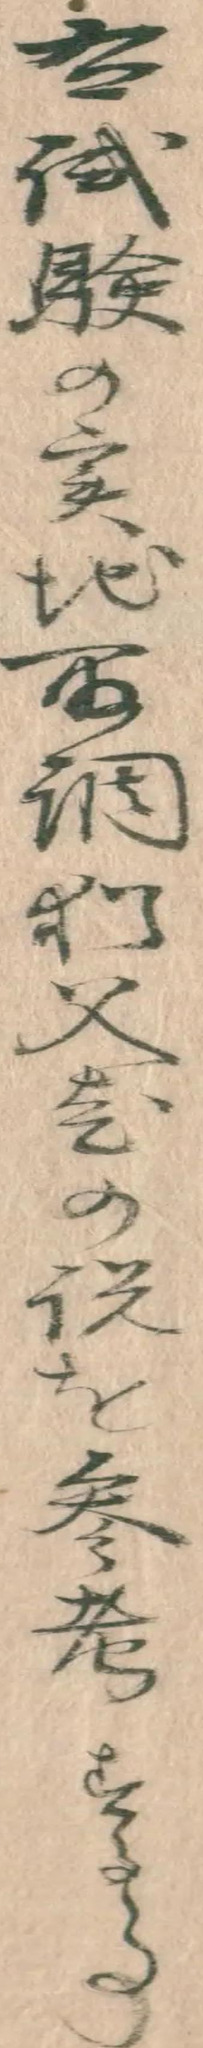右試験の実地取調猶父老の説を参考する事
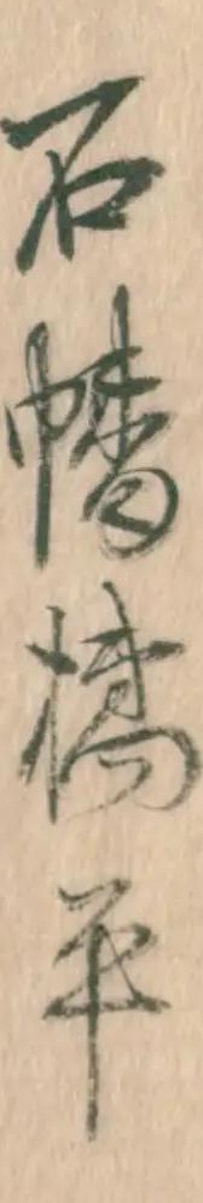石幡橋平
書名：蚕桑集成
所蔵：国立国会図書館 National Diet Library, JAPAN
